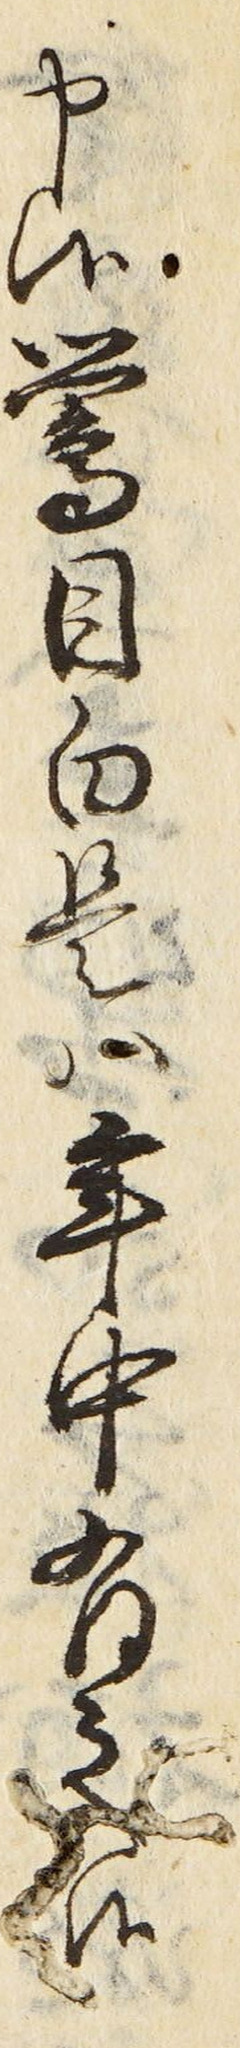申候鶯目白是ハ年中有之候
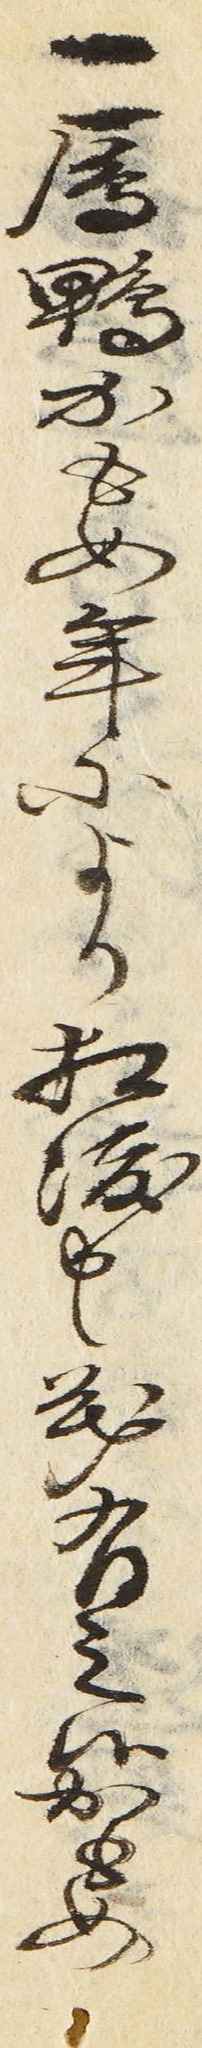一鳫鴨かもめ年により相渡申義有之候かもめ
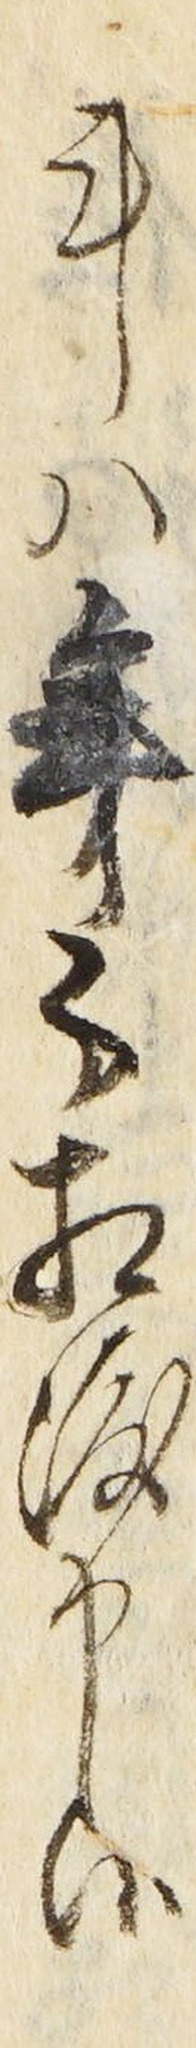斗ハ年々相渡申候
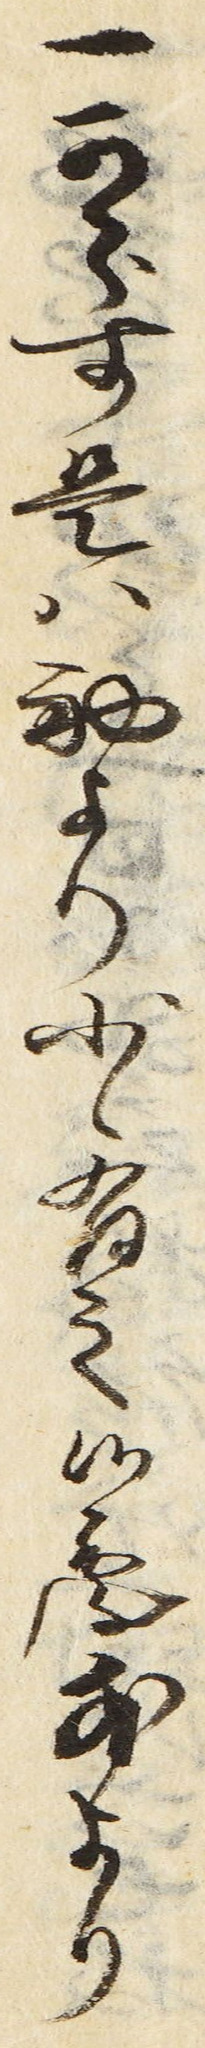一からす是ハ初より少々有之候処外より
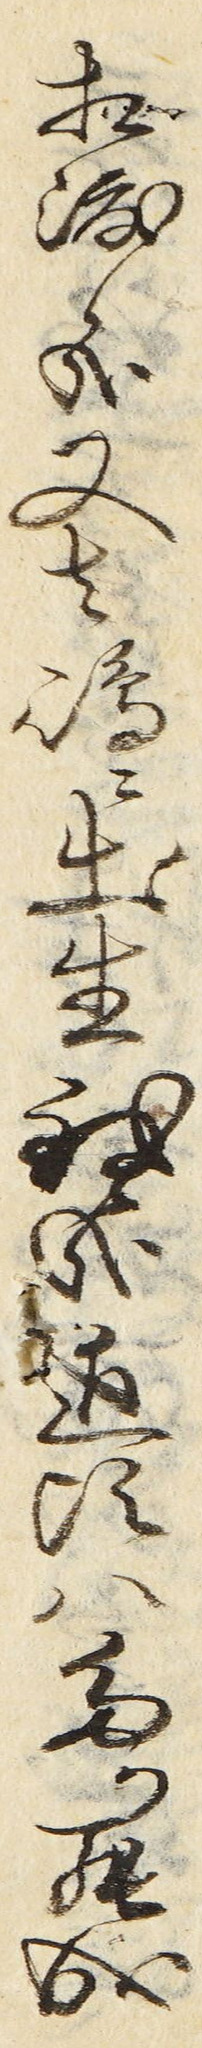相渡候哉又者嶋ニ出生致候哉近頃ハ多ク罷成
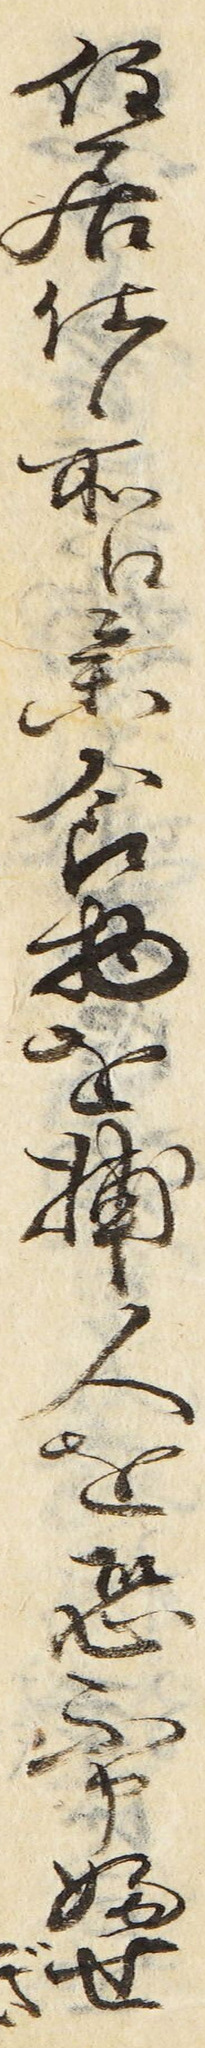住居仕候所江参食物を捕人を恐不申ふせぎ
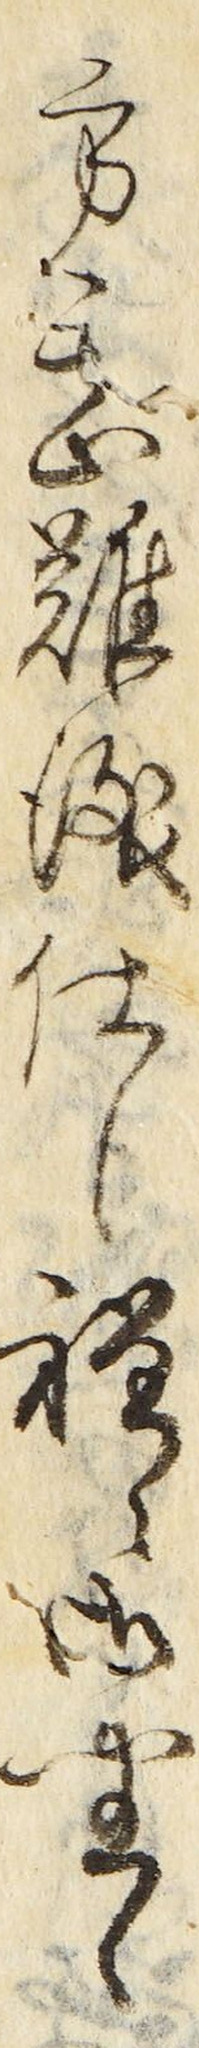方甚難儀仕候程ニ御座候
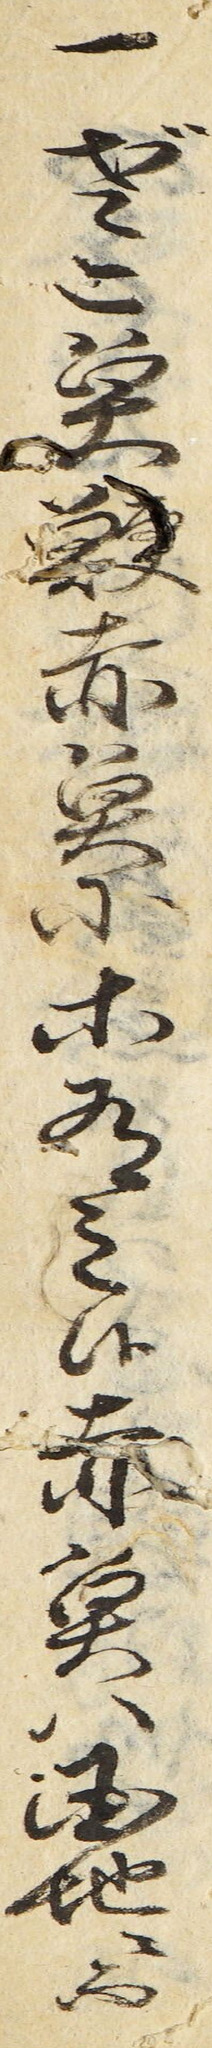一ざこ魚鯁赤魚小等有之候赤魚ハ国地ニ而

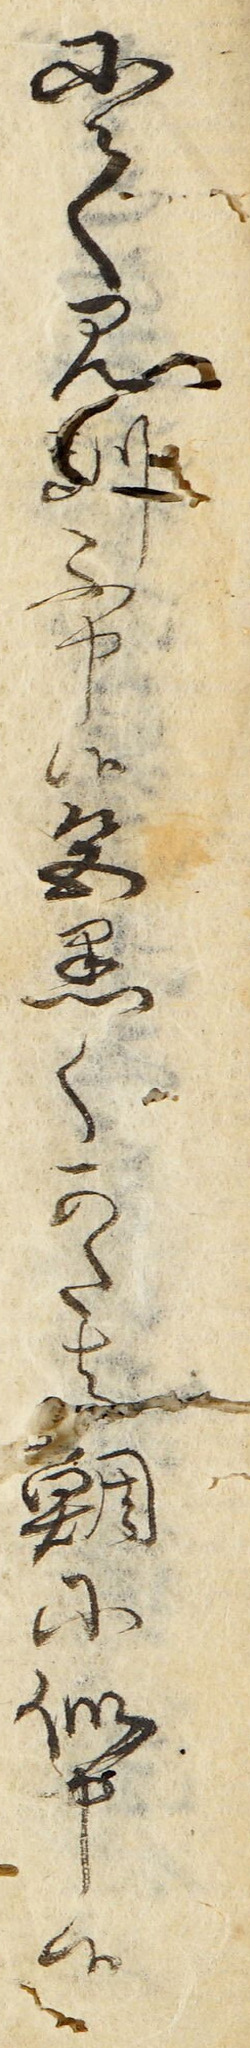にて見馴不申候色黒くかた者鯛に似申候
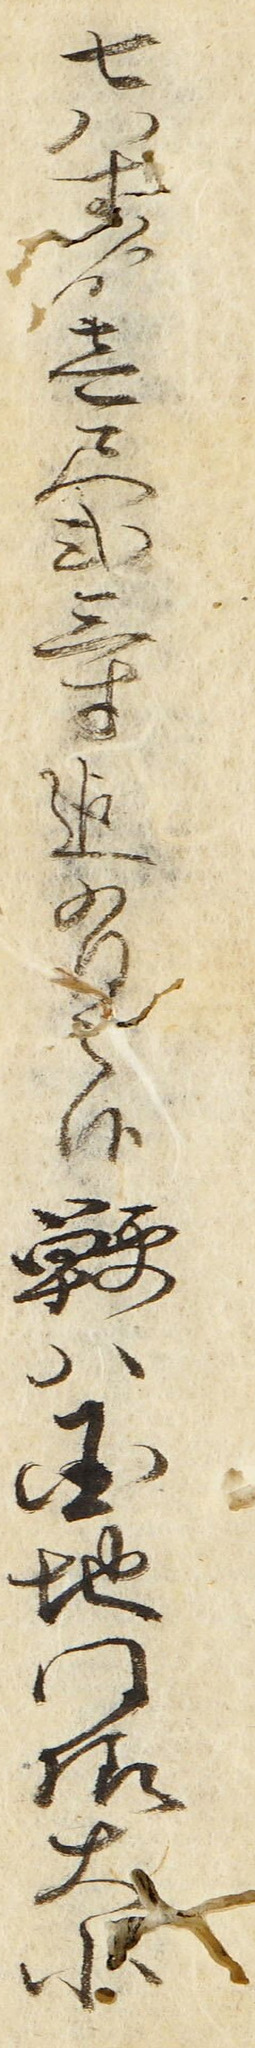七八寸ゟ壱尺弐三寸迄有之候鯁ハ国地同様大小
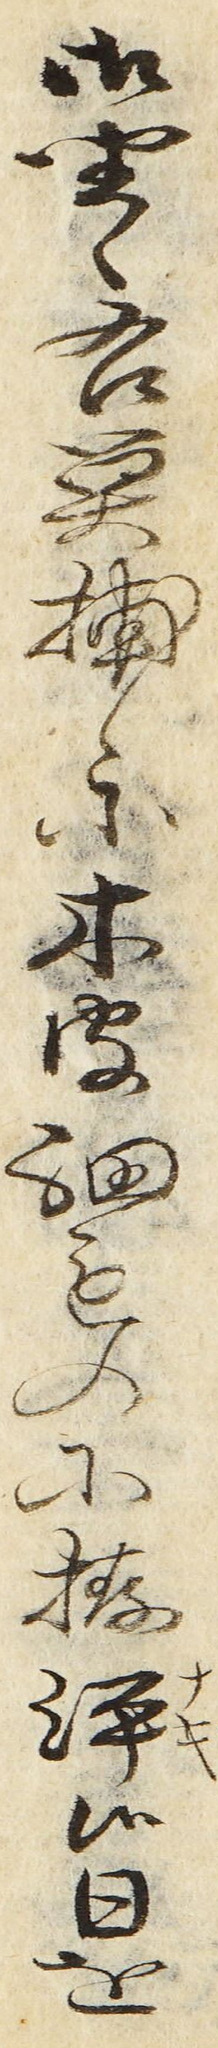御座候右魚捕候に木皮細ものに拵泙候日を
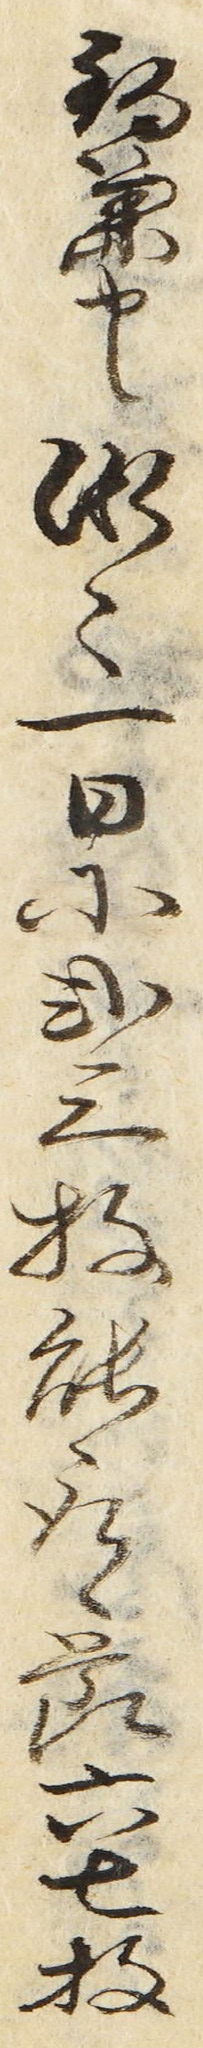釣兼申候漸々一日に弐三枚能取候節六七枚
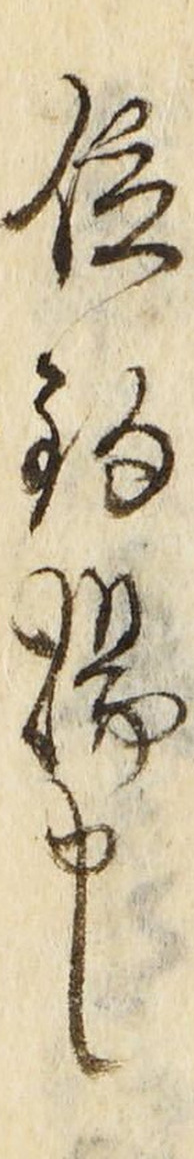位釣揚申候
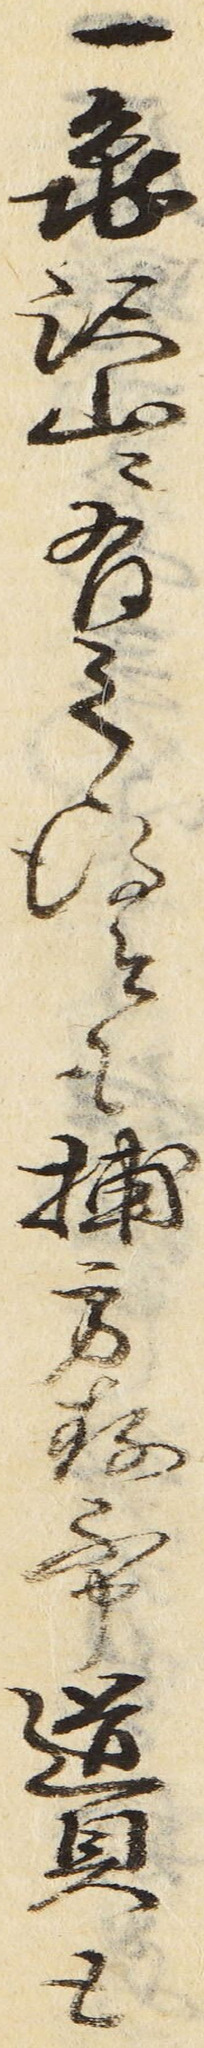一亀沢山ニ有之候得とも捕方存不申道具も
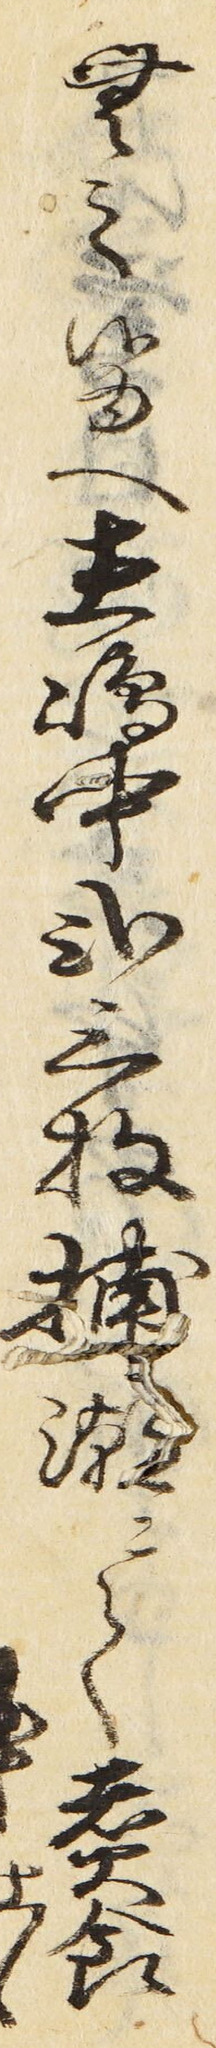無之候ゆへ在嶋中弐三枚捕潮ニて煮食事仕候
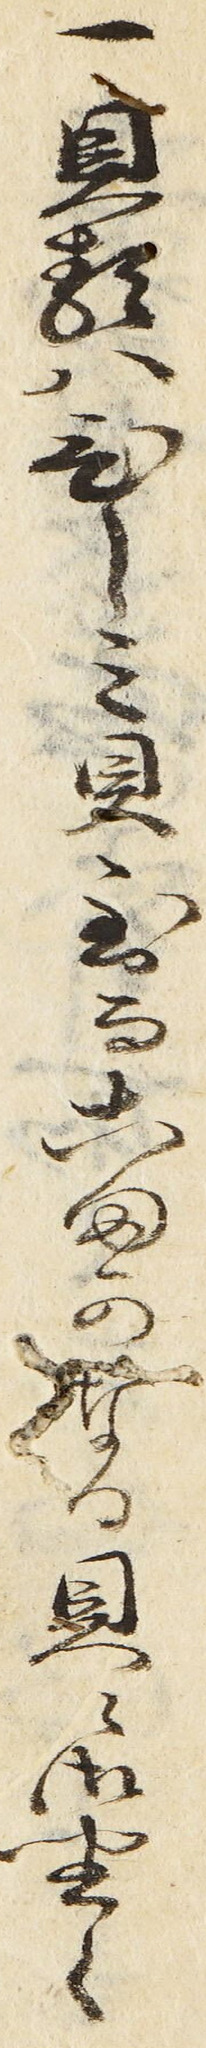一貝類ハひしみ貝至而こまかなる貝ニ御座候
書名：漂流一件上書
